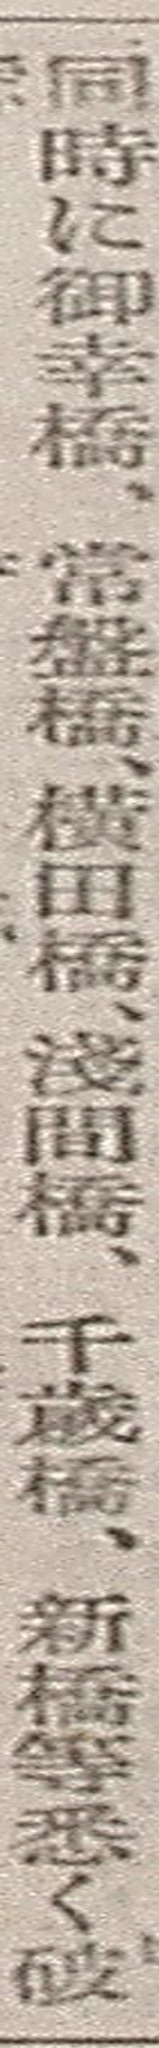同時に御幸橋、常盤橋、横田橋、浅間橋、千歳橋、新橋等悉く破
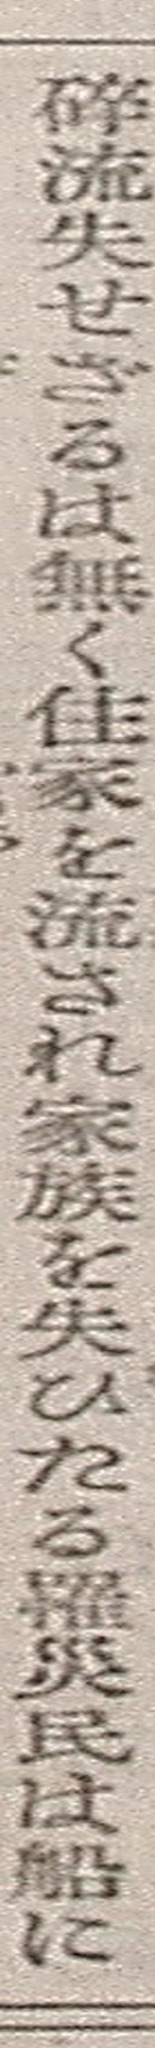碎流失せざるは無く住家を流され家族を失ひたる罹災民は船に
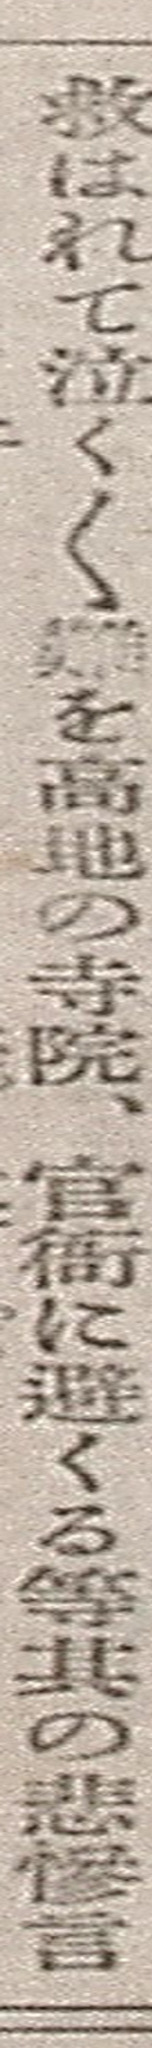救はれて泣く〳〵難を高地の寺院、官衛に避くる等其の悲惨言
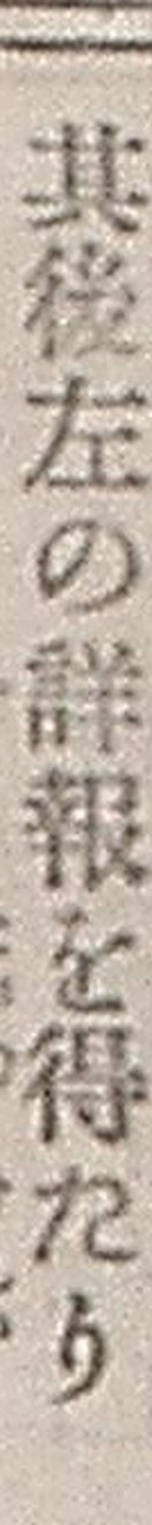其後左の詳報を得たり
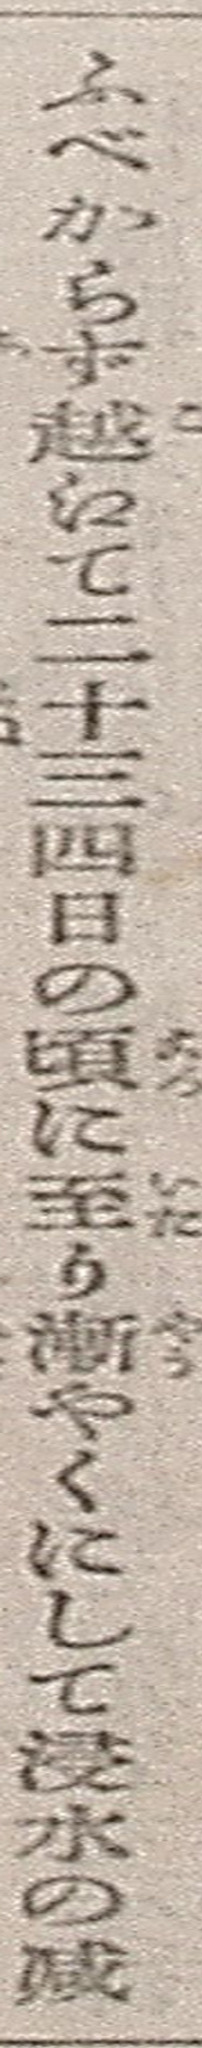ふべからず越江て二十三四日の頃に至り漸やくにして浸水の減
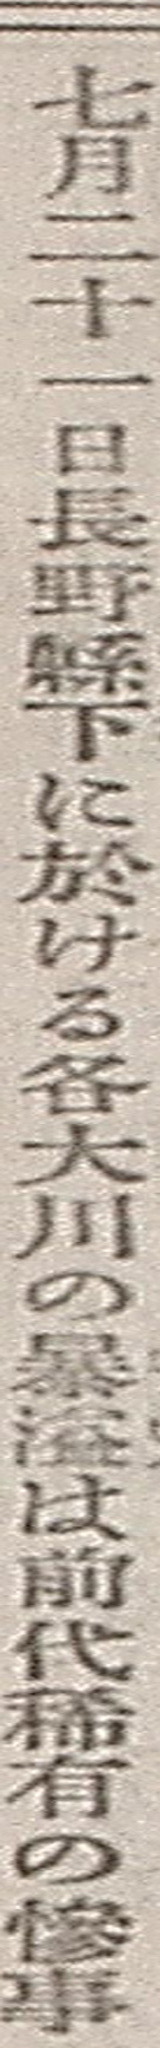七月二十一日長野県下に於ける各大川の暴溢は前代稀有の惨事
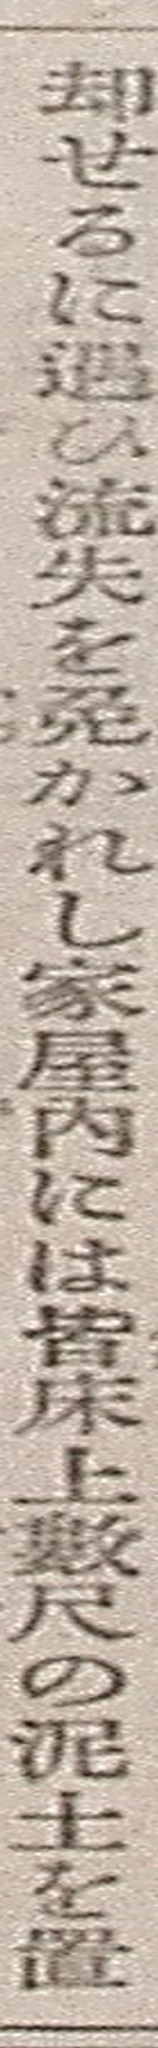却せるに遭ひ流失を免かれし家屋内には皆床上数尺の泥土を置
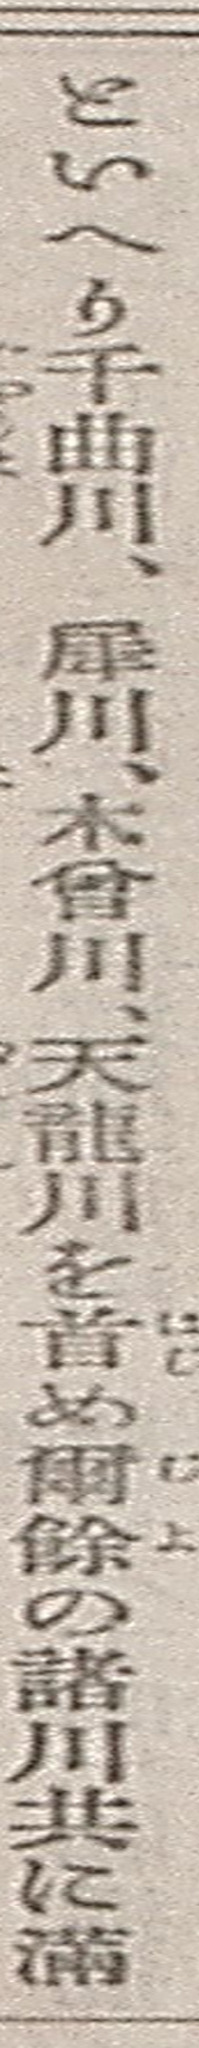といへり千曲川、犀川、木曽川、天竜川を首め爾餘の諸川共に満
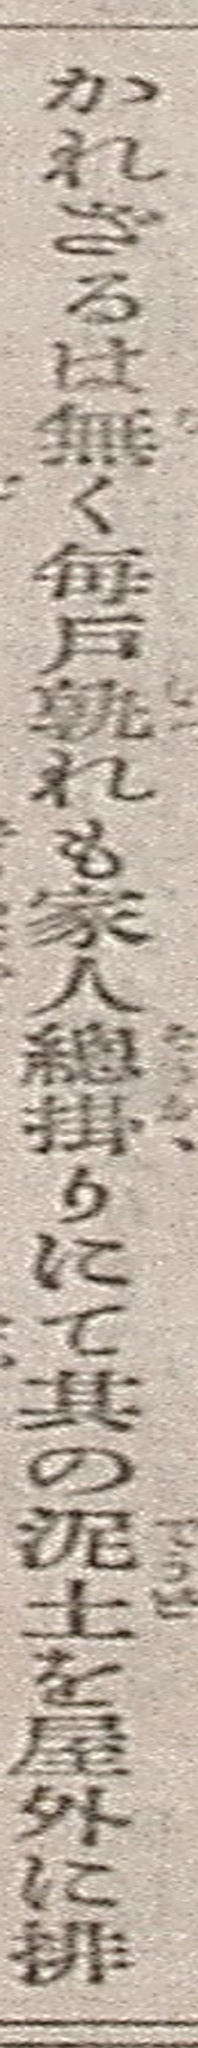かれざるは無く毎戸孰れも家人総掛りにて其の泥土を屋外に排
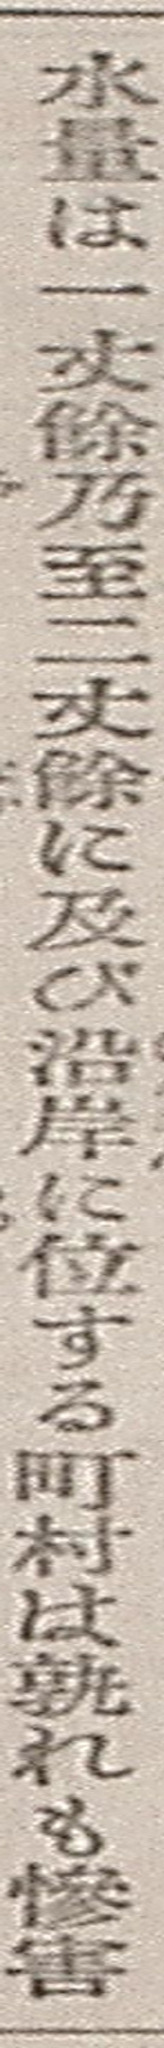水量は一丈餘乃至二丈餘に及び沿岸に位する町村は孰れも惨害
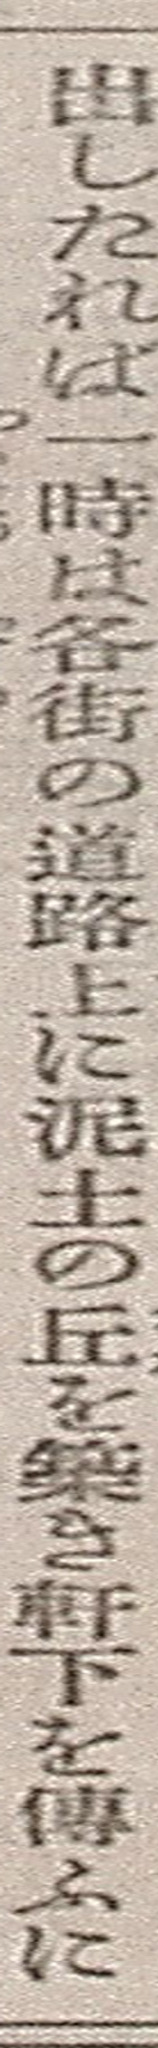出したれば一時は各街の道路上に泥土の丘を築き軒下を傳ふに
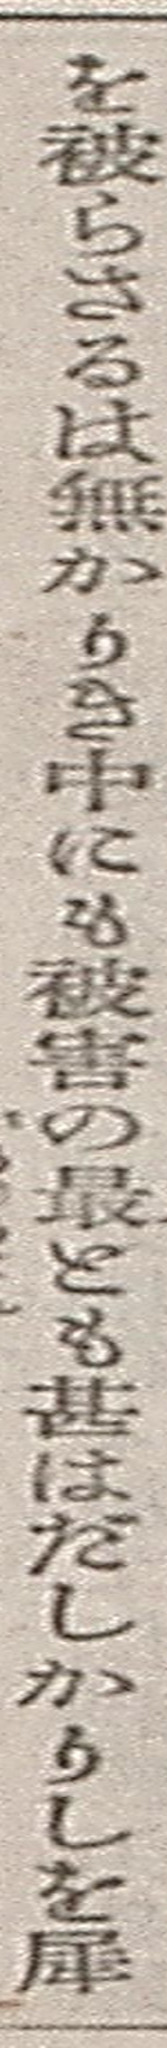を被らさるは無かりき中にも被害の最とも甚はだかりしを犀
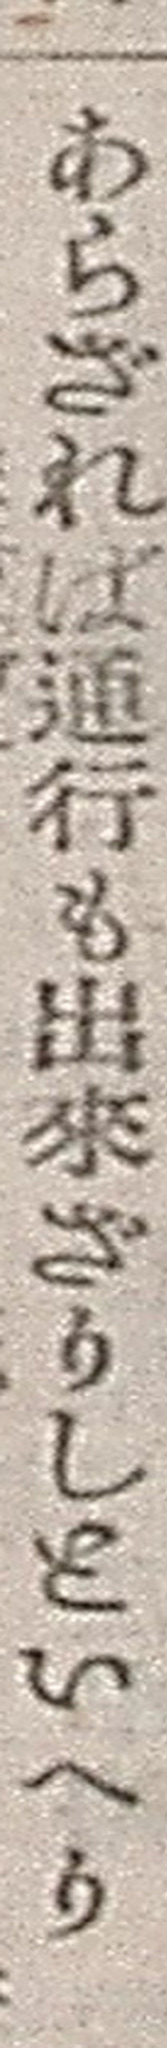あらざれば通行も出来ざりしといへり
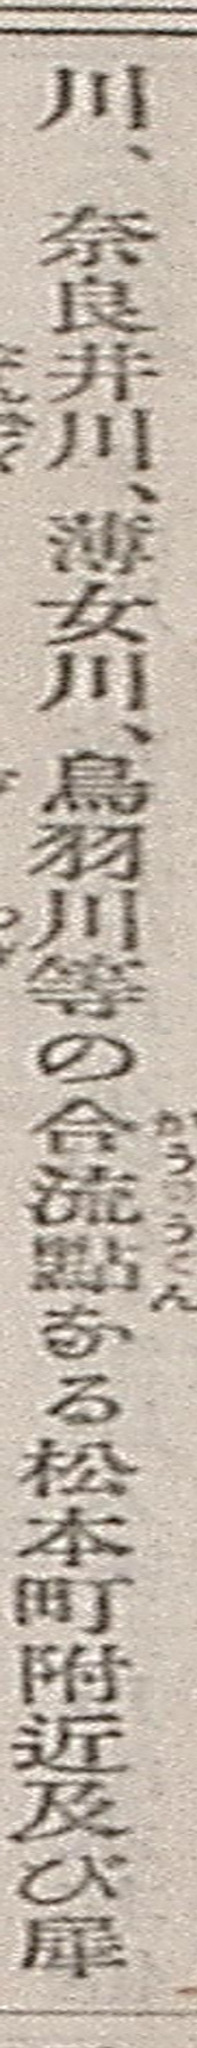川、奈良井川、薄女川、鳥羽川等の合流点なる松本町附近及び犀
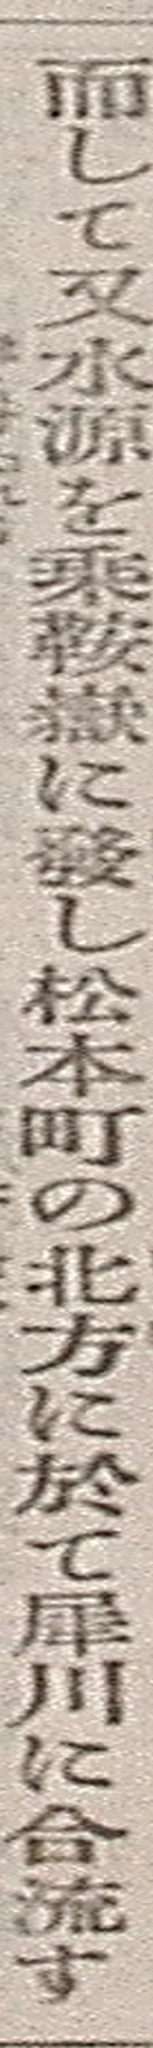而して又水源を乗鞍嶽に発し松本町の北方に於て犀川に合流す
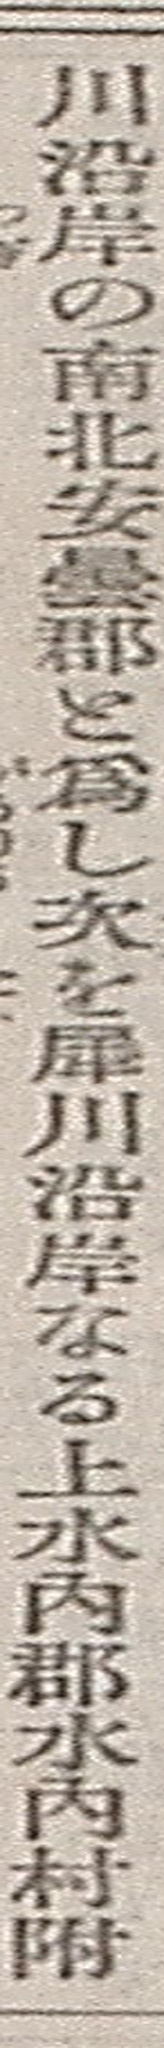川沿岸の南北安曇郡と為し次を犀川沿岸なる上水内郡水内村附
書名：風俗畫報臨時増刊第百二十六號　洪水被害録（中）
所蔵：東京大学地震研究所図書室 Earthquake Research Institute Library, The University of Tokyo, JAPAN
